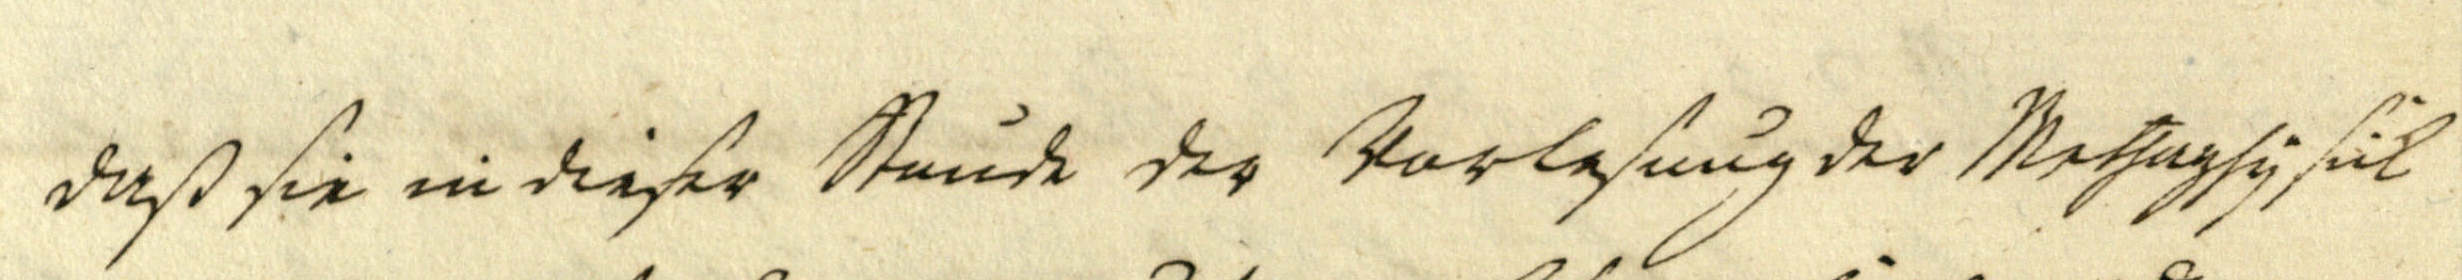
daß sie in dieser Stunde der Vorlesung der Methaphÿsick
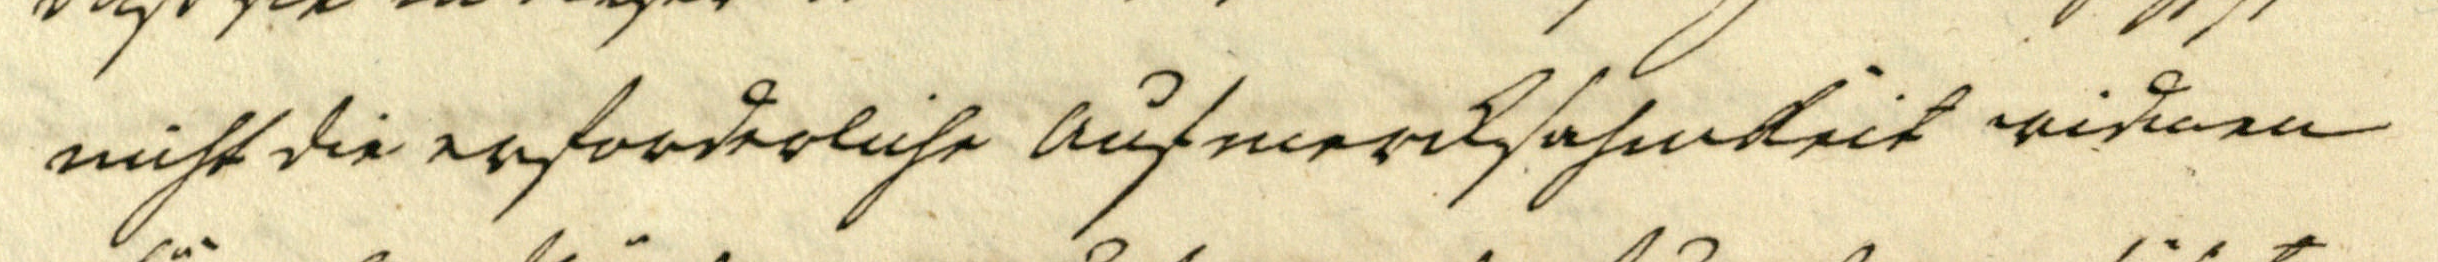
nicht die erforderliche Aufmercksahmkeit widmen
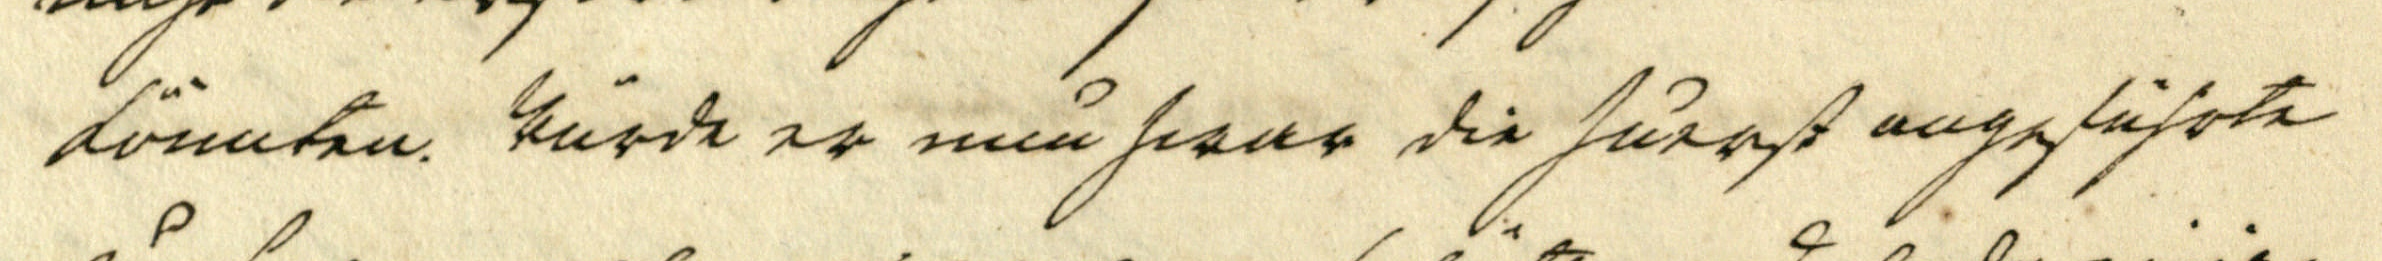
könnten. Würde er nun zwar die zuerst angeführte
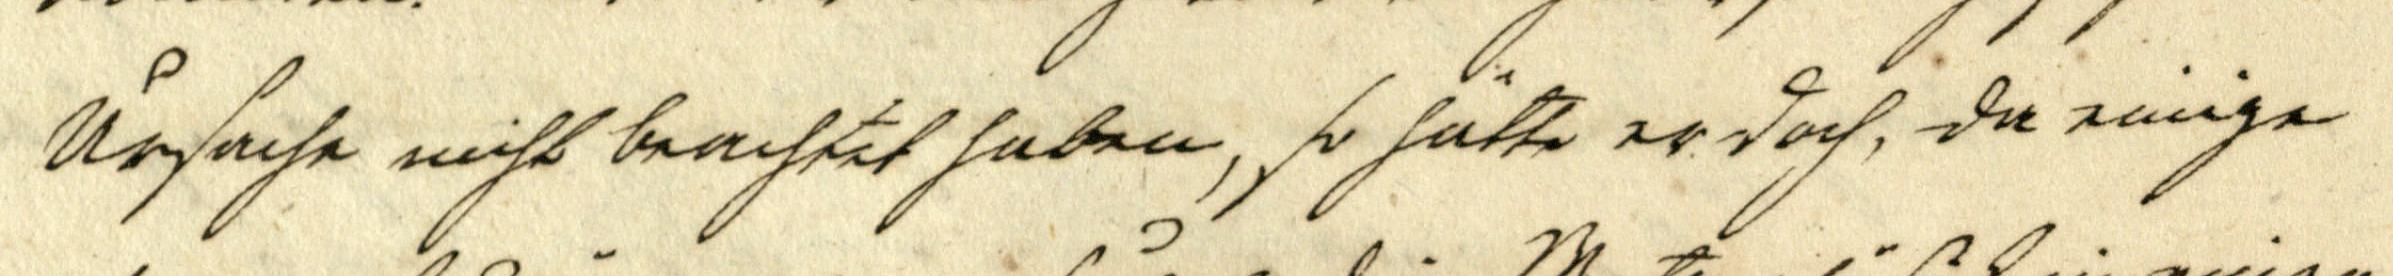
Ursache nicht beachtet haben, so hätte er doch, da einige
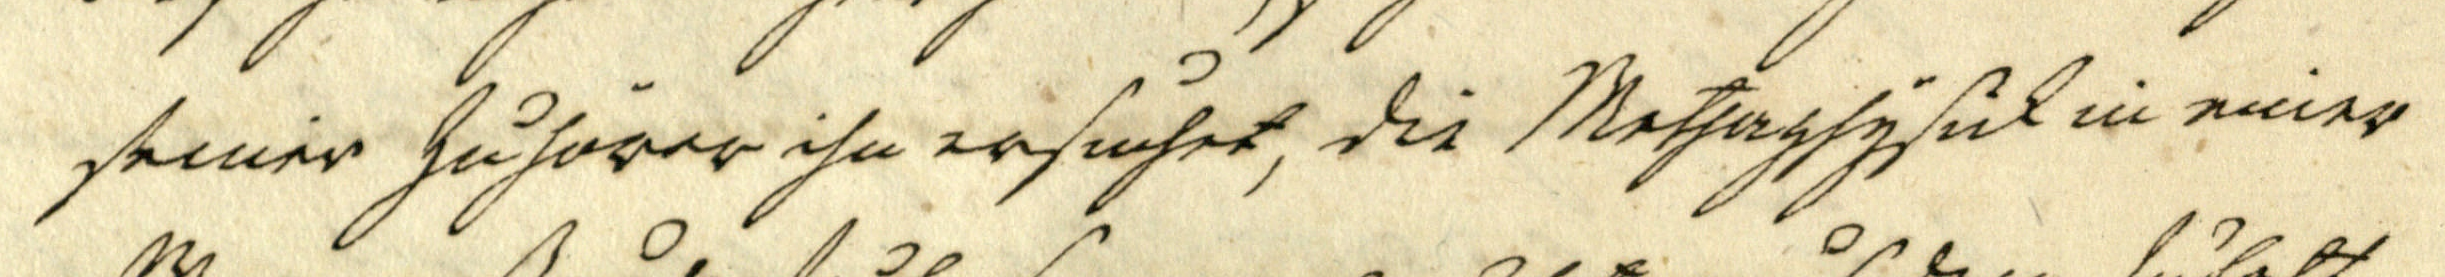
seiner Zuhörer ihn ersuchet, die Methaphÿsick in einer
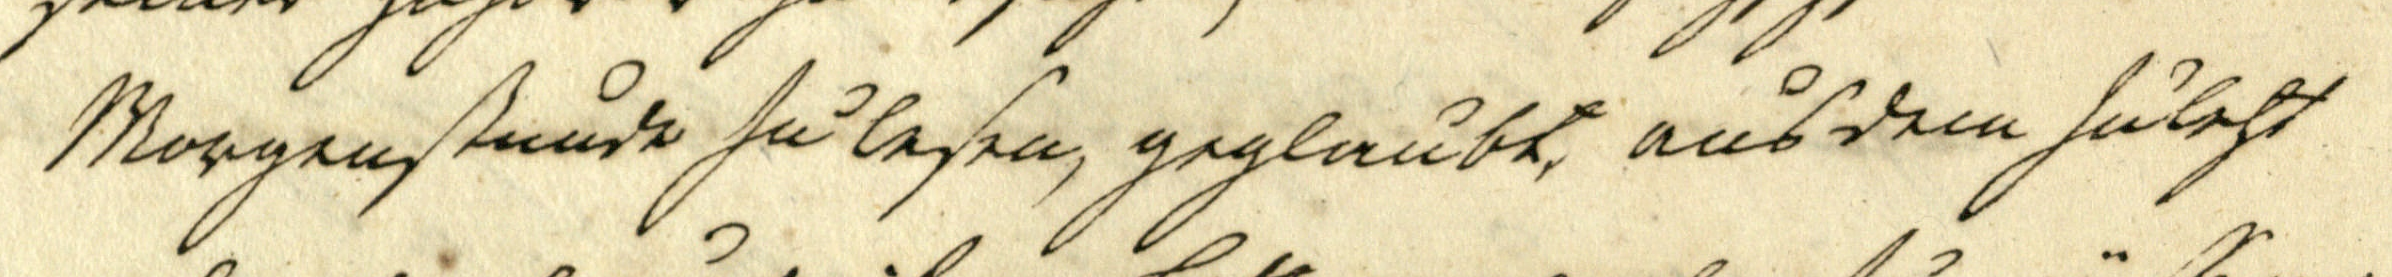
Mogenstunde zu lesen, geglaubt, aus dem zuletzt
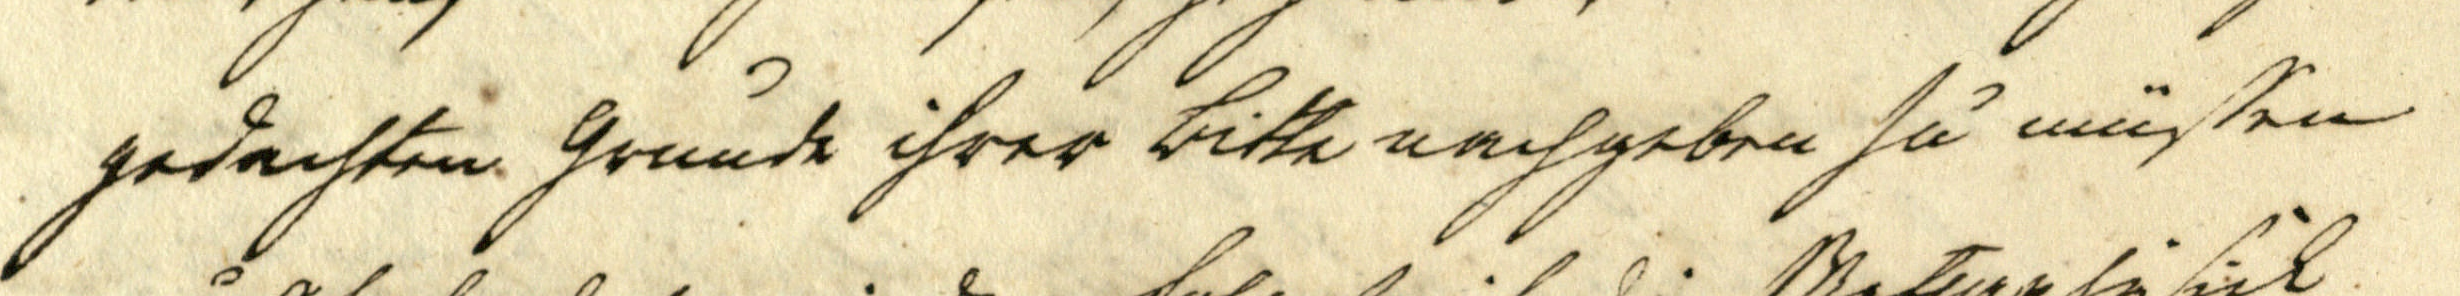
gedachten Grunde ihrer Bitte nachgeben zu müssen
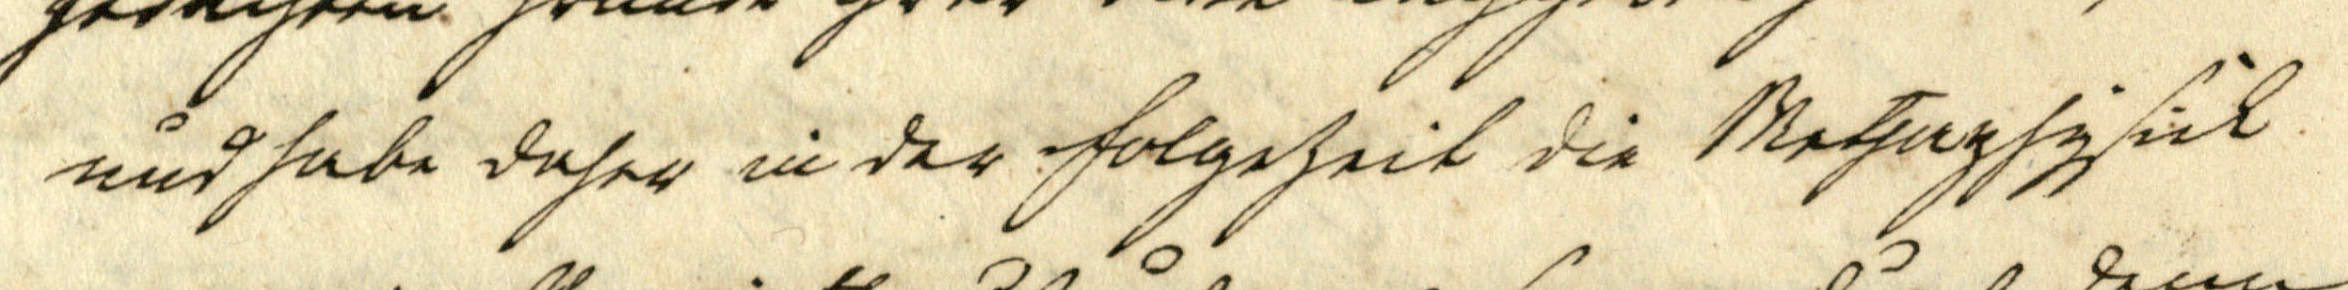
und habe daher in der Folgezeit die Methaphÿsick
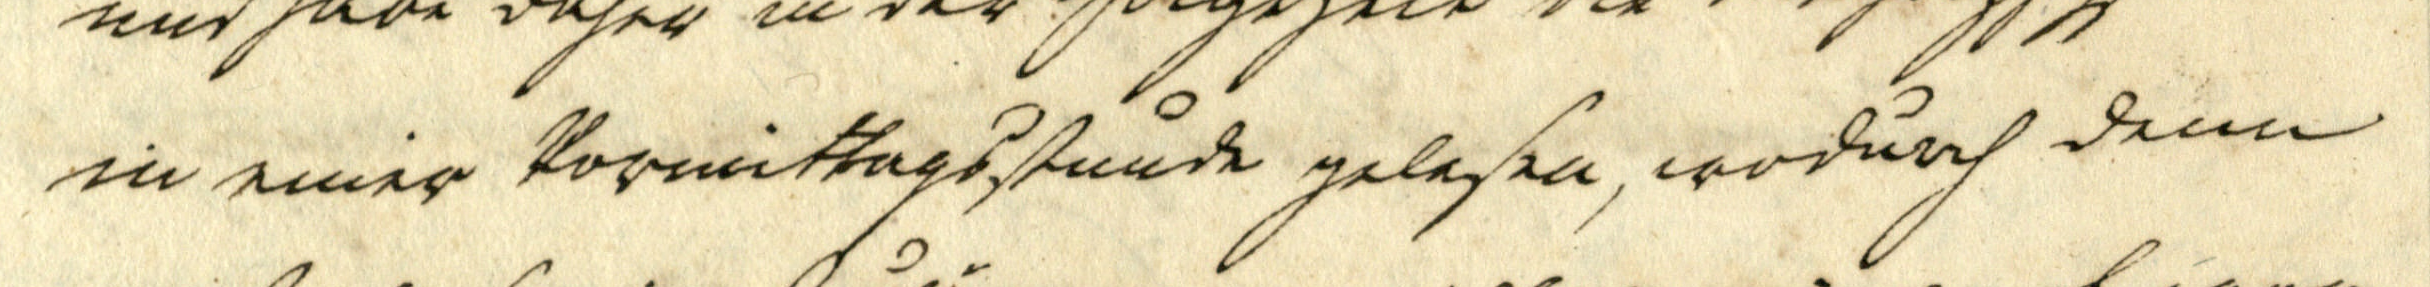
in einer Vormittagstunde gelesen, wodurch denn
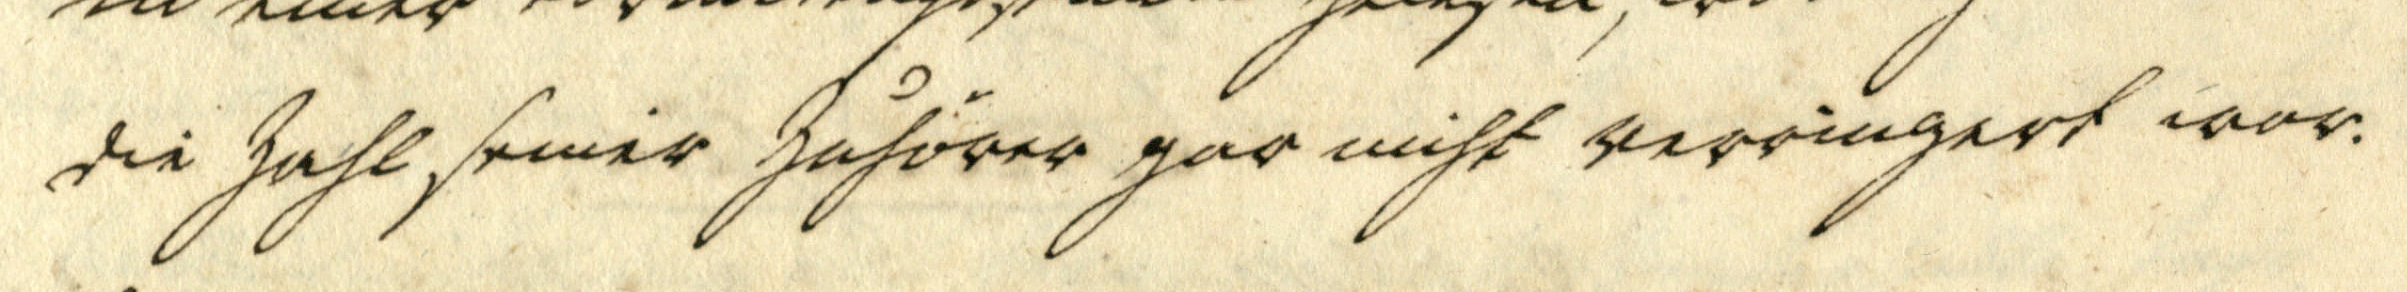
die Zahl seiner Zuhörer gar nicht verringert wor¬
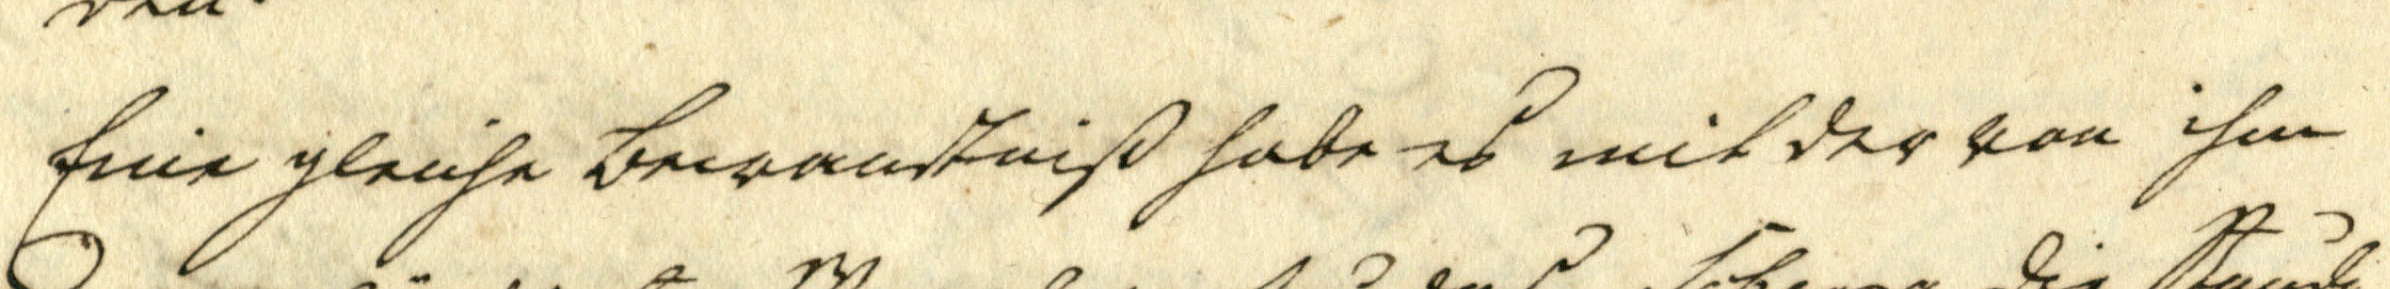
Eine gleiche Bewandtniß habe es mit der von ihm
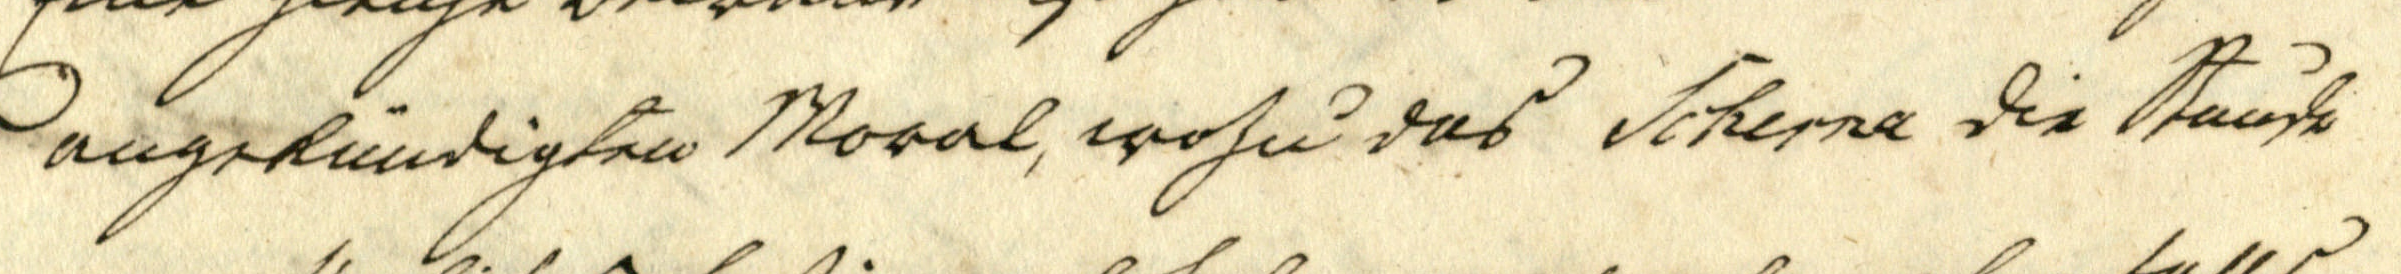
angekündigten Moral, wozu das Schema die Stunde
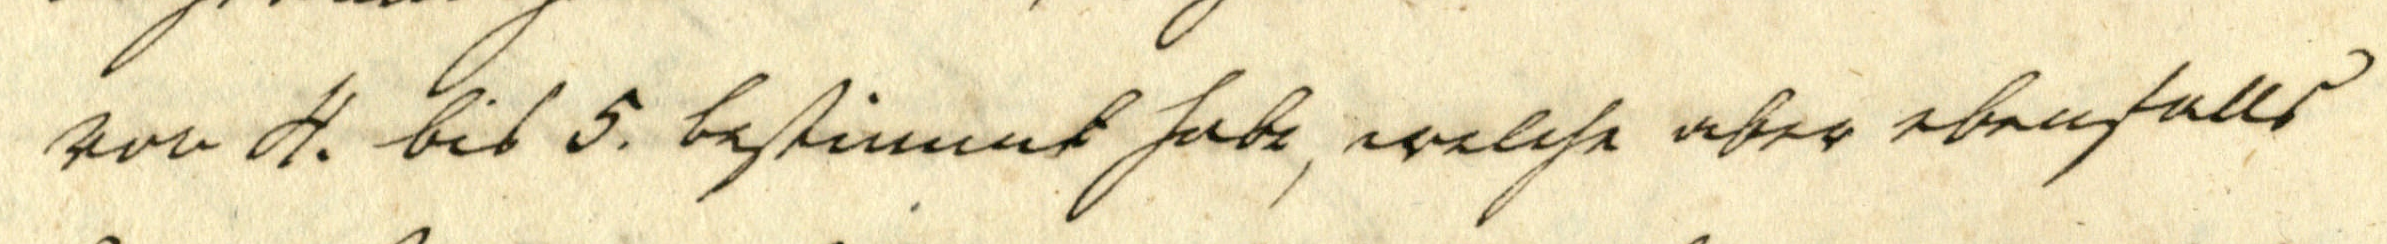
von 4. bis 5. bestimmt habe, welche aber ebenfalls
